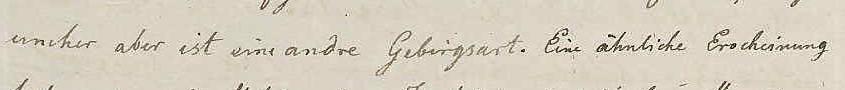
umher aber ist eine andre Gebirgsart. Eine ähnliche Erscheinung
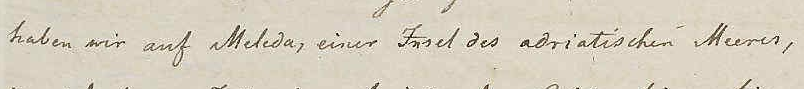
haben wir auf Meleda, einer Insel des adriatischen Meeres,
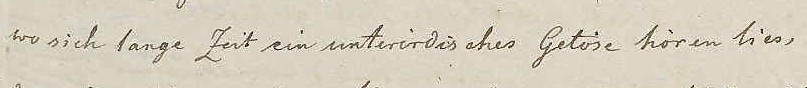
wo sich lange Zeit ein unterirdisches Getöse hören lies,
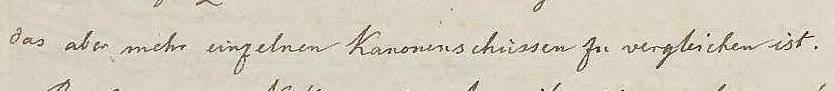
das aber mehr einzelnen Kanonenschüssen zu vergleichen ist.
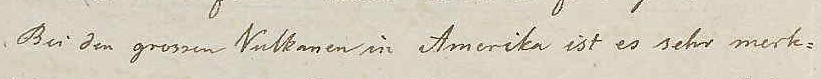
Bei den grossen Vulkanen in Amerika ist es sehr merk-
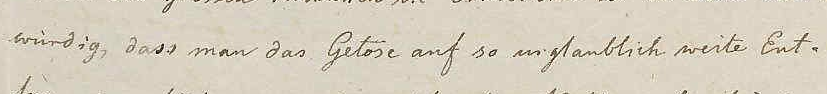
würdig, dass man das Getöse auf so unglaublich weite Ent-
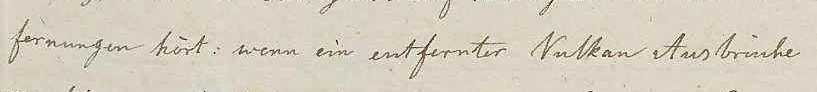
fernungen hört: wenn ein entfernter Vulkan Ausbrüche
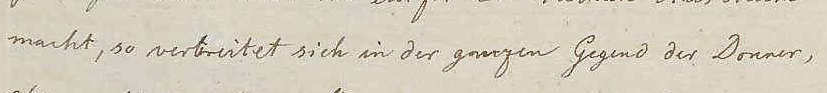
macht, so verbreitet sich in der ganzen Gegend der Donner,
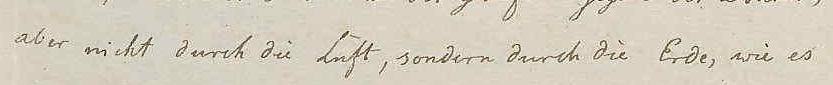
aber nicht durch die Luft, sondern durch die Erde, wie es
